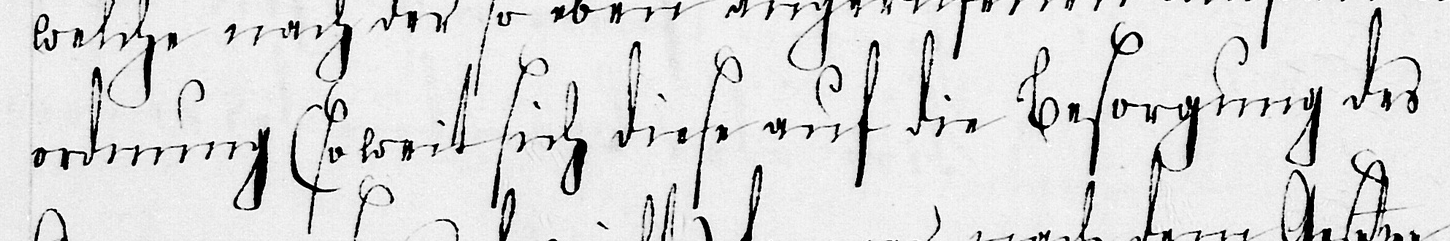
ordnung (soweit sich diese auf die Besorgung des
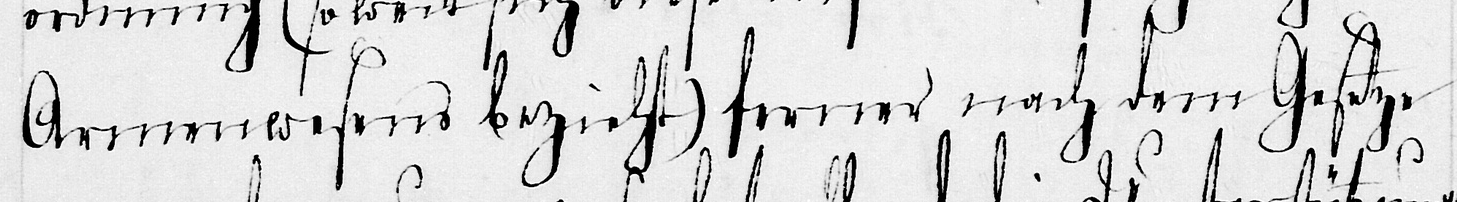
Armenwesens bezieht) ferner nach dem Gesetze
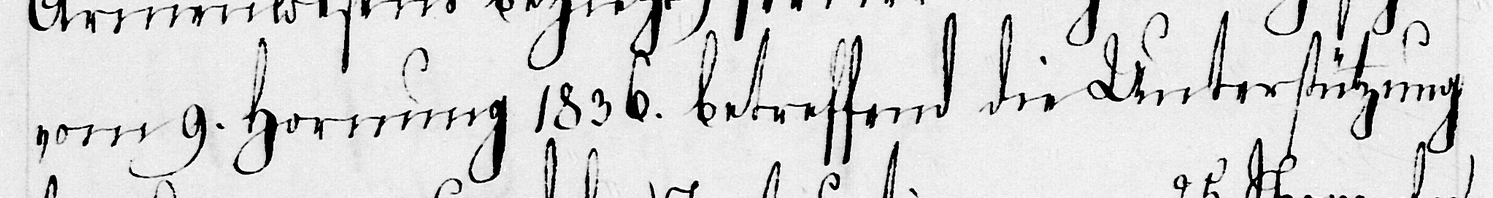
vom 9. Hornung 1836. betreffend die Unterstützung
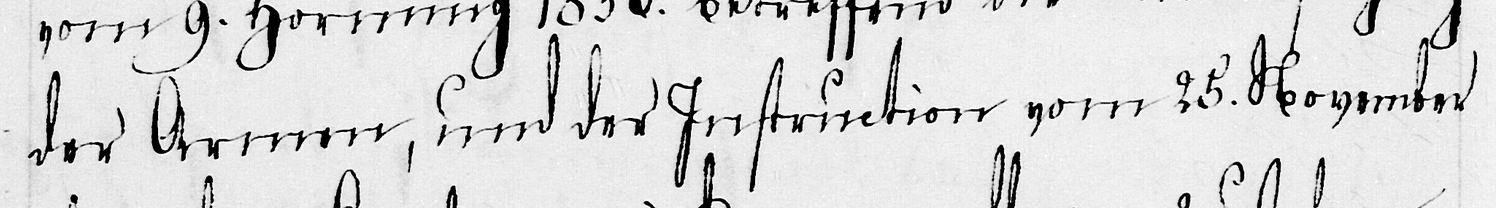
der Armen, und der Instruction vom 25. November
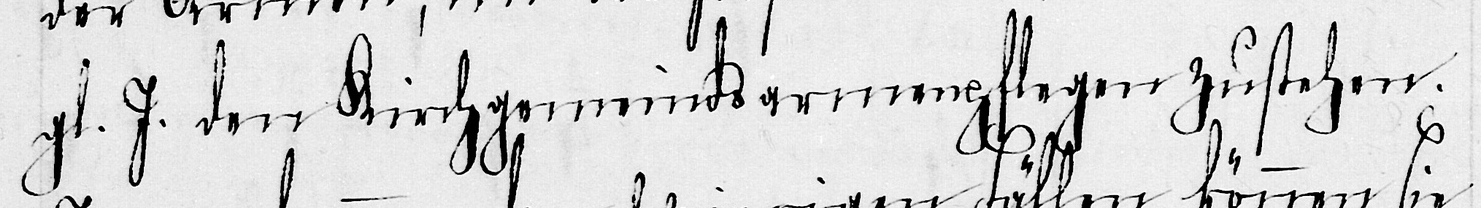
gl. J. den Kirchgemeindsarmenpflegen zustehen.
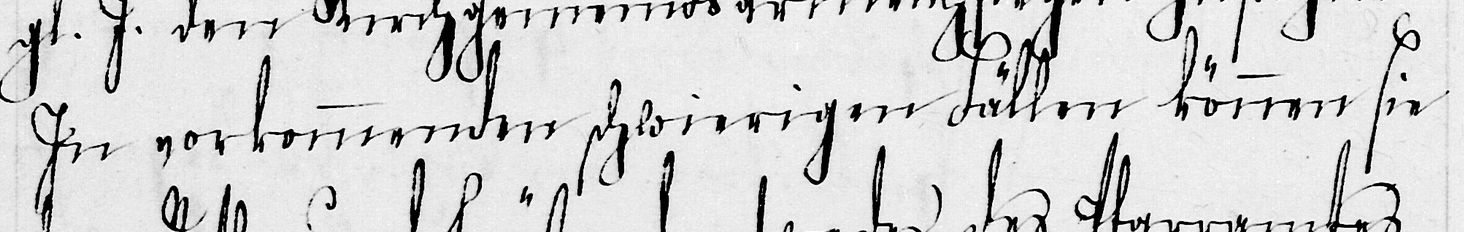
In vorkommenden schwierigen Fällen können sie
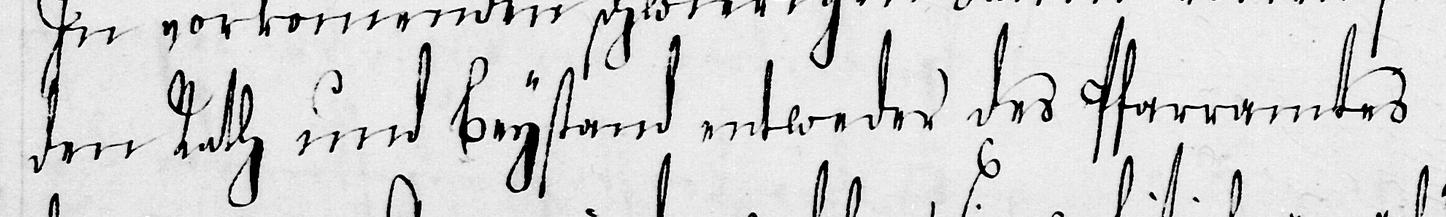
den Rath und Beystand entweder des Pfarramtes
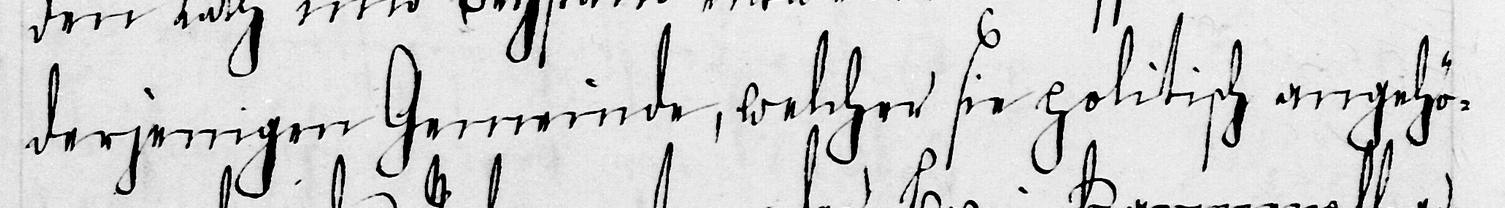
derjenigen Gemeinde, welcher sie politisch angehö¬
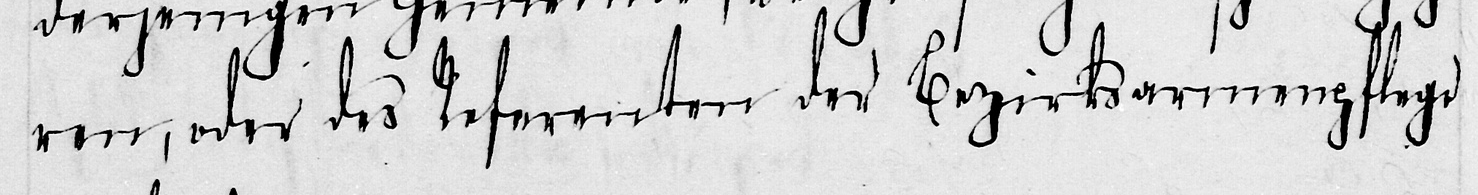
ren, oder des Referenten der Bezirksarmenpflege
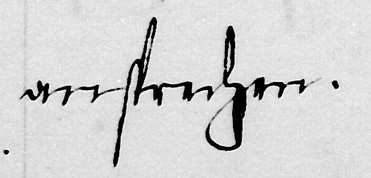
ansprechen.
